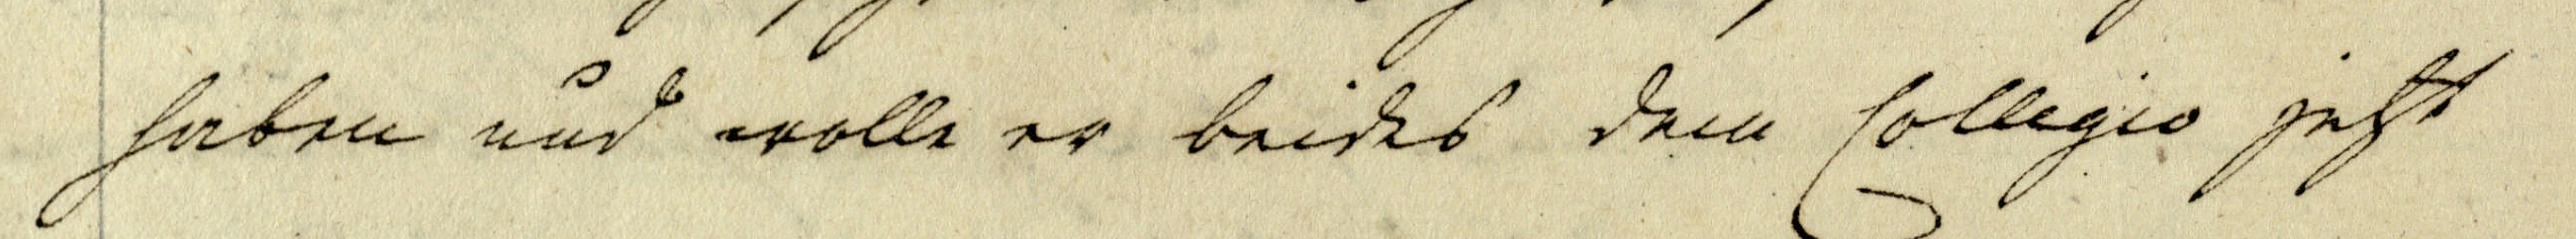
haben und wolle er beides dem Collegio jetzt
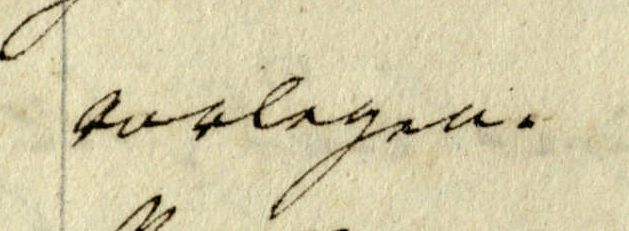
vorlegen.
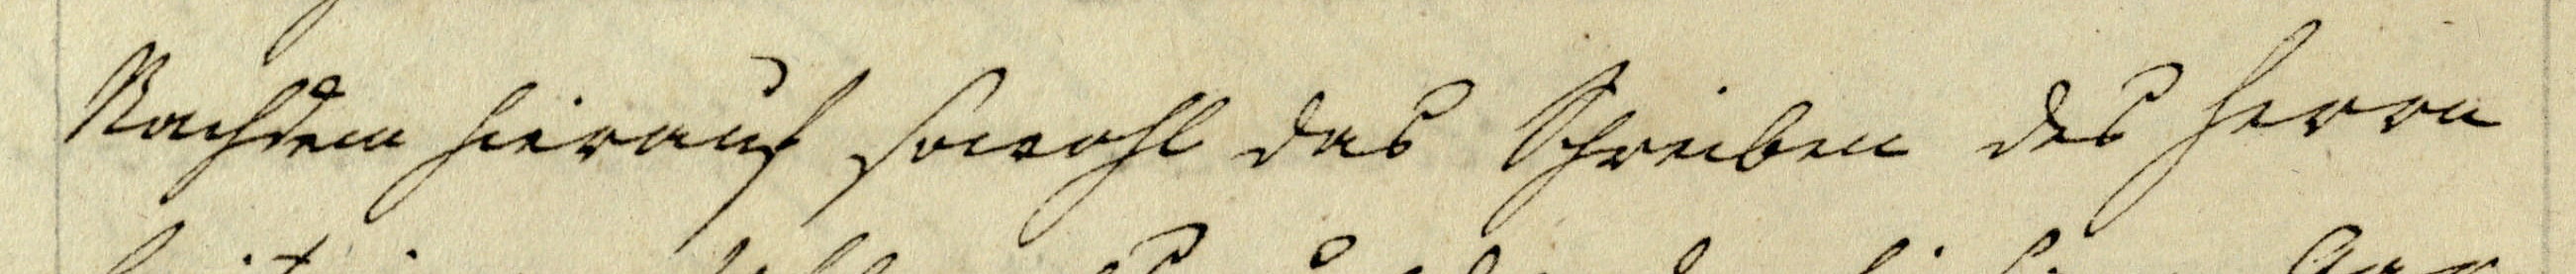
Nachdem hierauf sowohl das Schreiben des Herrn
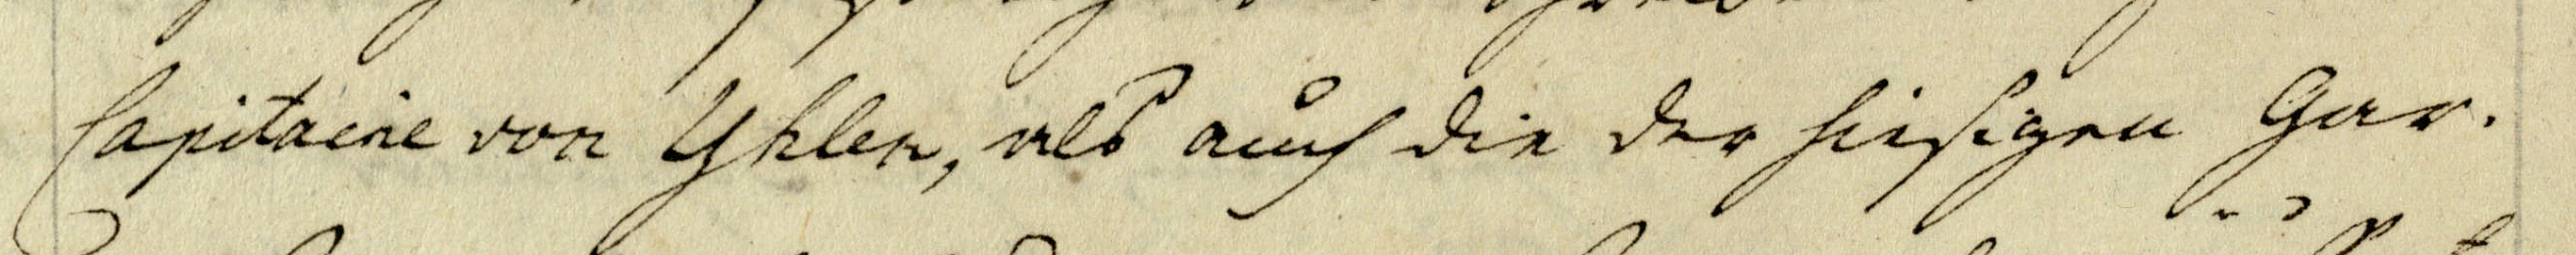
Capitaine von Yhlen, als auch die der hiesigen Gar¬
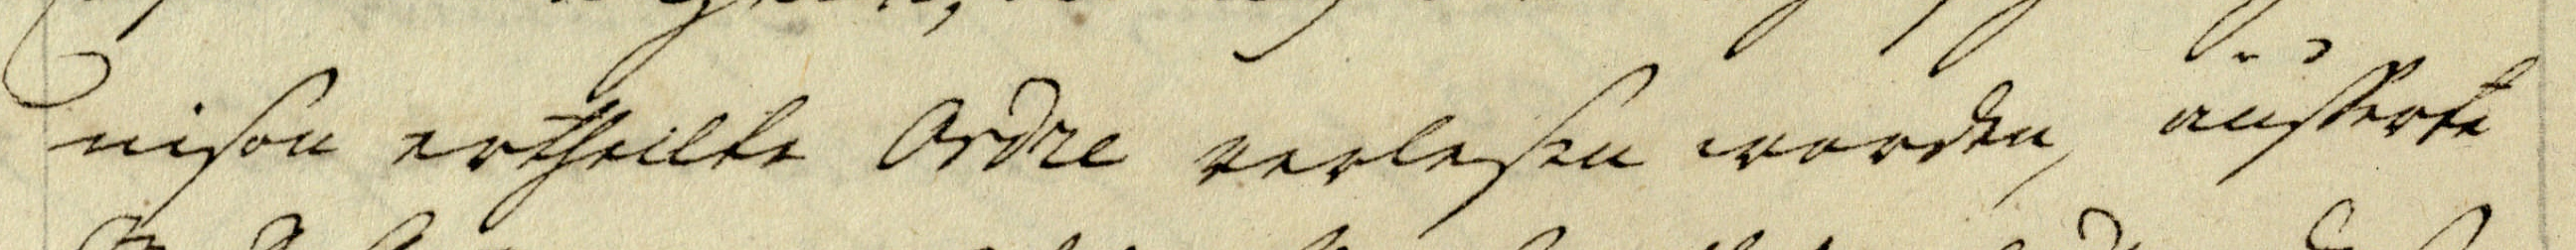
nison ertheilte Ordre verlesen worden, äusserte
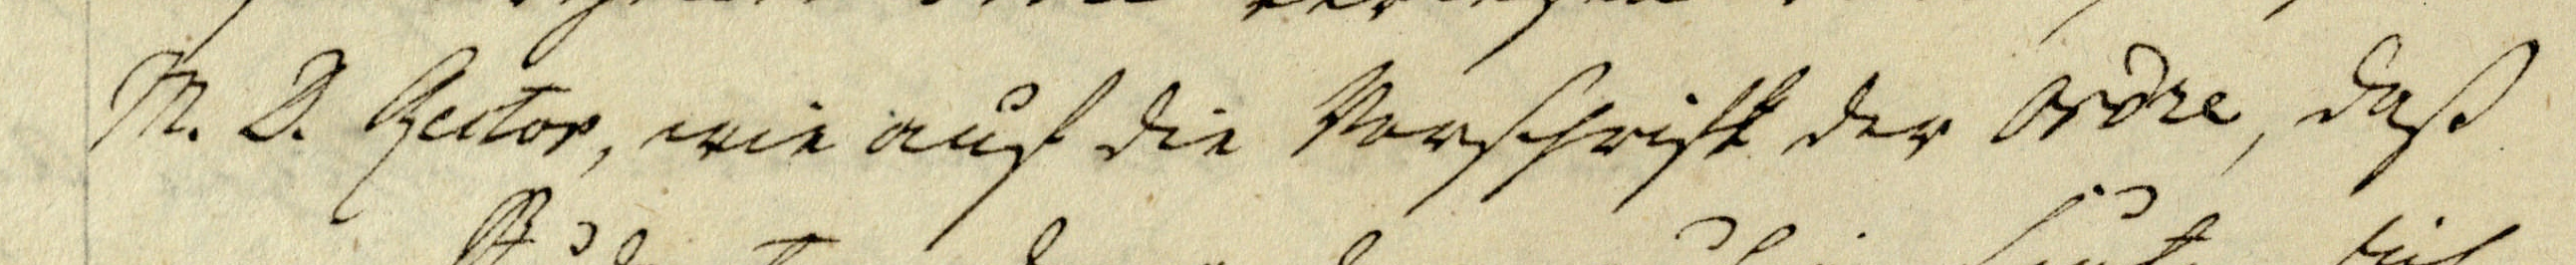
M. D. Rector, wie auf die Vorschrift der Ordre, daß
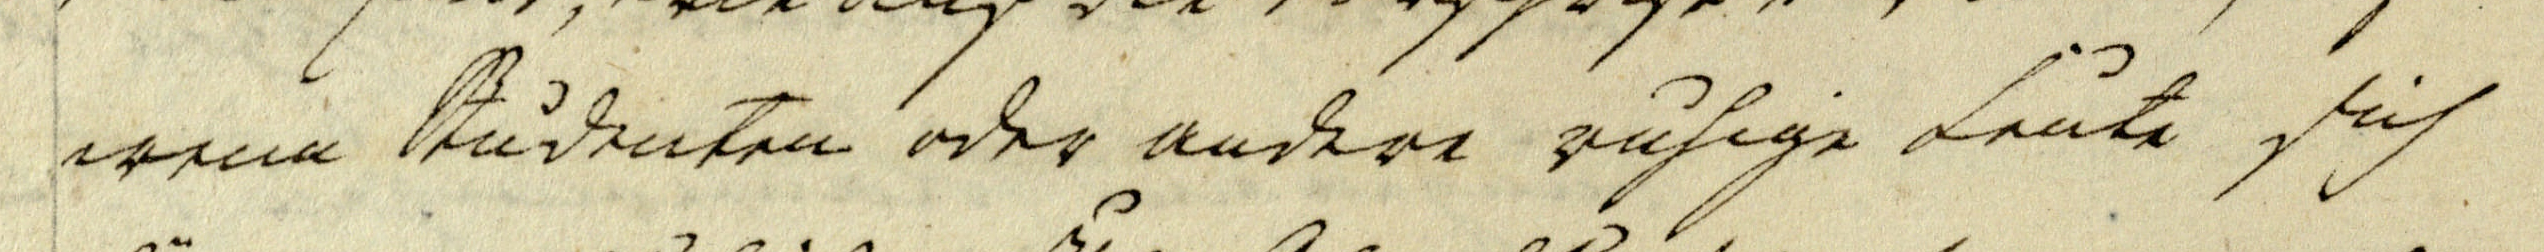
wenn Studenten oder andere ruhige Leute sich
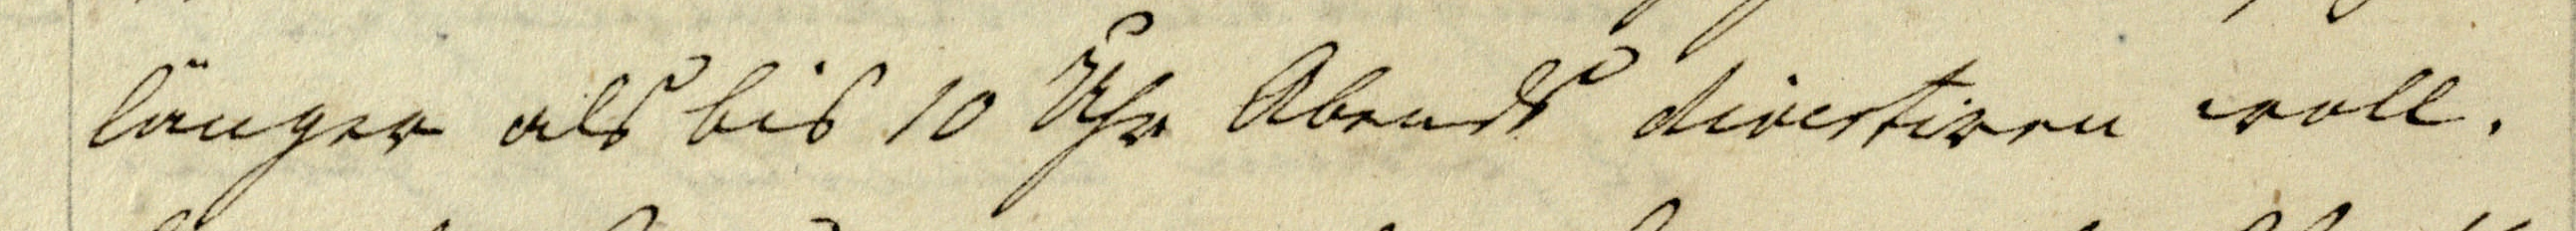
länger als bis 10 Uhr Abends divertiren woll¬
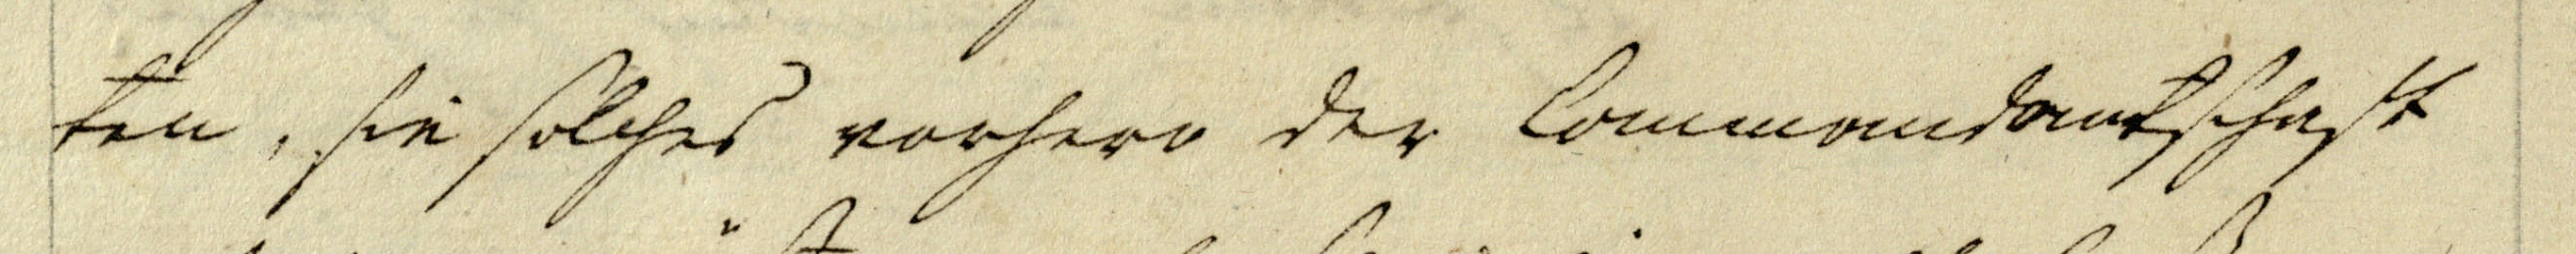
ten, sie solches vorhero der Commandantschaft
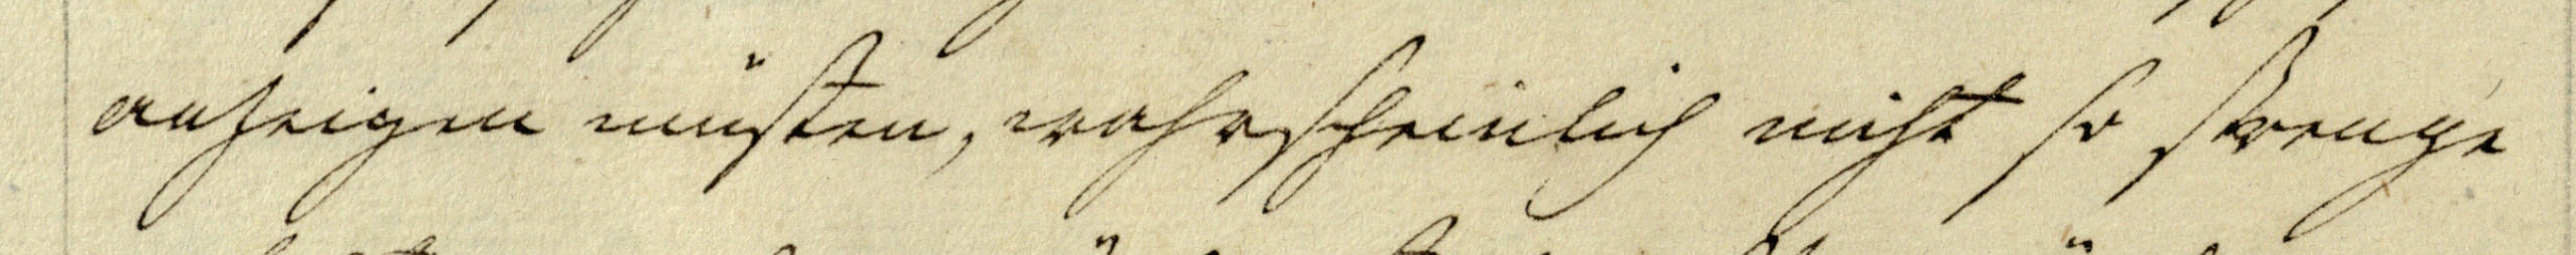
anzeigen müßten, wahrscheinlich nicht so strenge
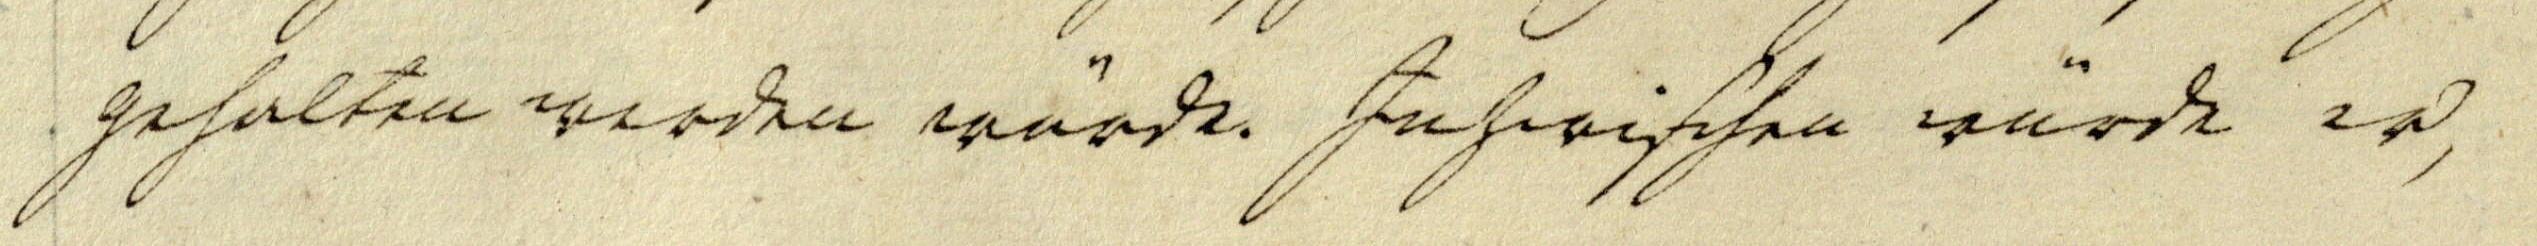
gehalten werden würde. Inzwischen würde er,
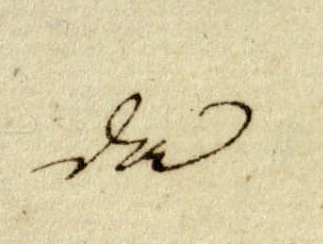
da
